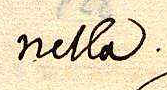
nella.
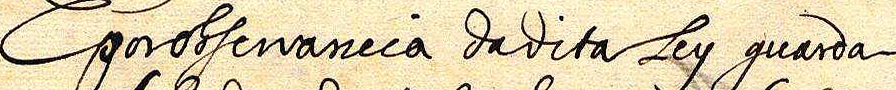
E por observancia da dita Ley guarda
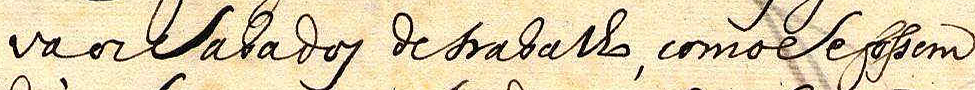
va oz Sabados de trabalho, como se fossem
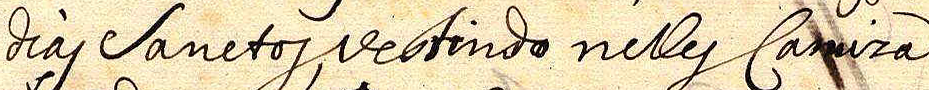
dias Sanctos, vestindo nelles Camiza
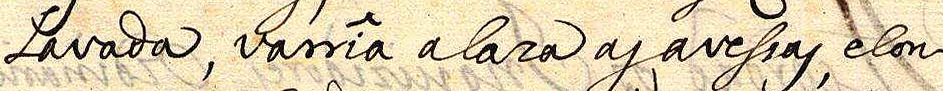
Lavada, varria a Caza as avessas, e Con
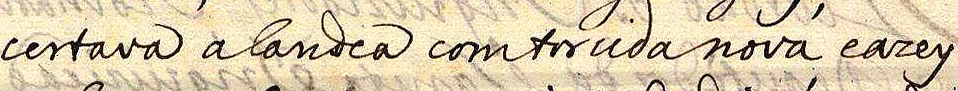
certava a Candea com torcida nova, e azey
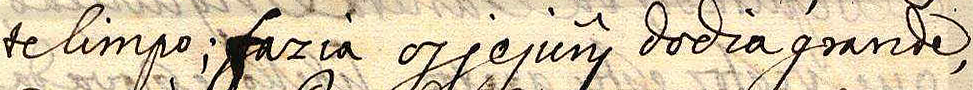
te limpo; fazia os jejuns do dia grande,
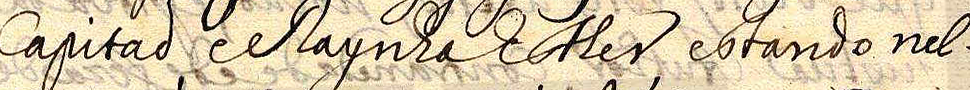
Capitaõ, e Raynha Esther, estando nel
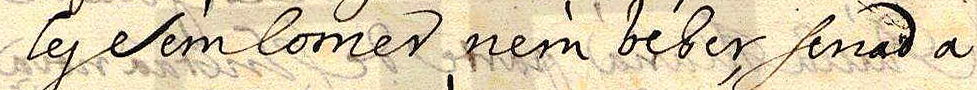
les Sem Comer nem beber, senaõ a
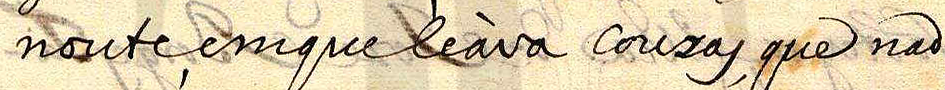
noute, em que Ceava couzas que naõ
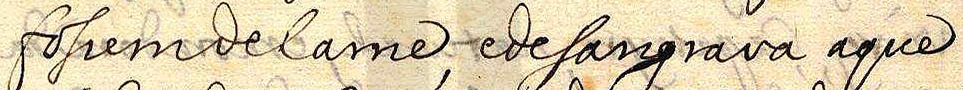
fossem de Carne, e desangrava a que
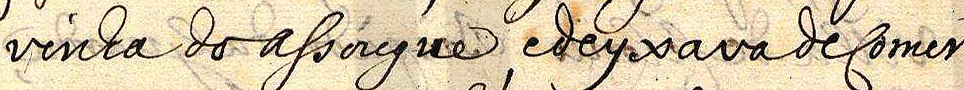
vinha do assougue, e deyxava de Comer
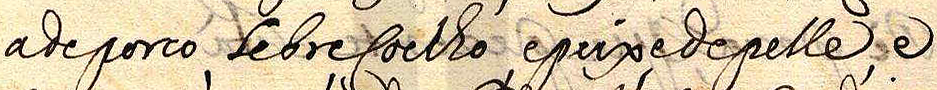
a de porco, Lebre, Coelho, e peixe de pelle, e
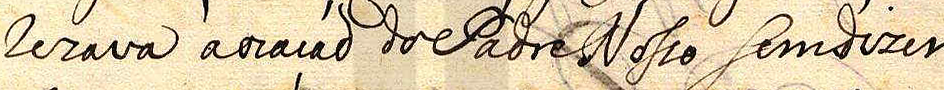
Rezava a oraçaõ do Padre Nosso sem dizer
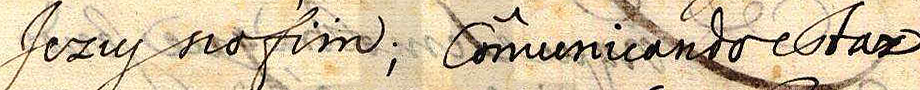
Jezus no fim; Com̄unicando estaz
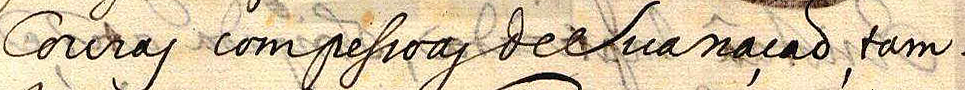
Couzas com pessoas de Sua naçaõ, tam
